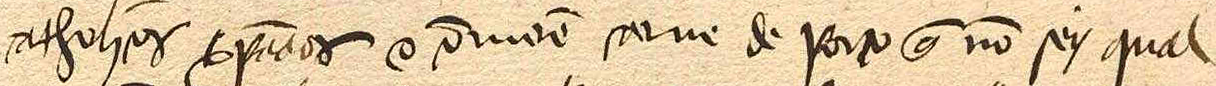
catholjcos xpãaos e c̄omerē carne de porco q̄ nō sey qual
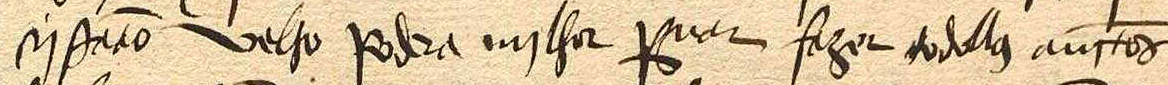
crjstaão velho podera mjlhor ꝓuar fazer todolloꝯ auc̄tos
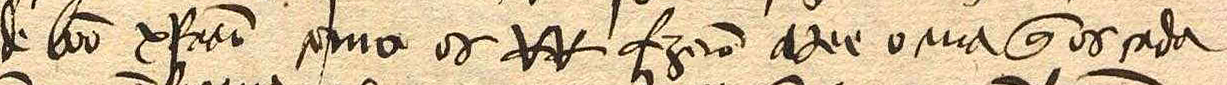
de bōo xpaão como os RR fezerō atee o cura q̄ os cada
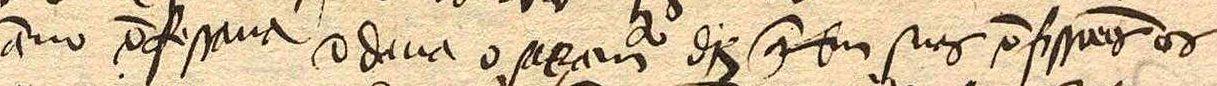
āno c̄ofessaua e daua o sacramto djz q̄ Em suas c̄ofissõees os
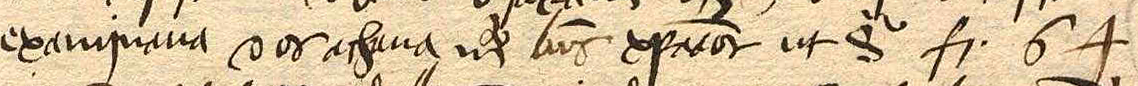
examjnaua e os achaua mto boōs xpãaos ut S̄ fi. 64
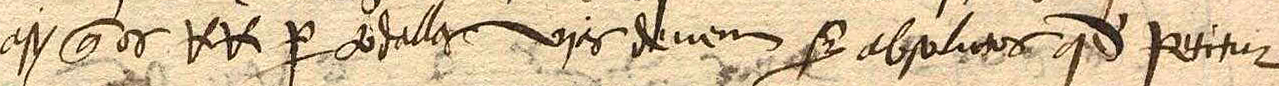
asy q̄ os RR ꝑ todallas vjas deuem ꞩ absolutos qd' petitur
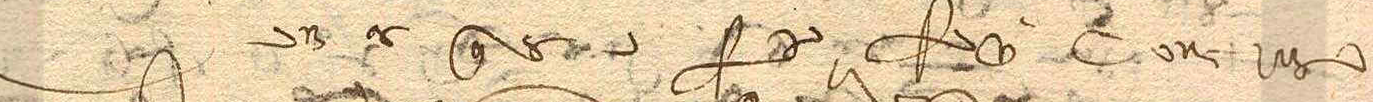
Com as q̄es o fto foy concruso
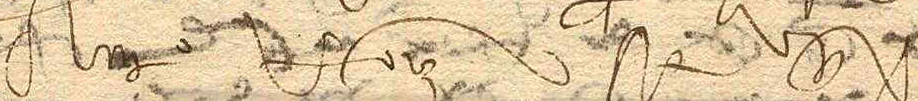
Anto Roīz o spivy
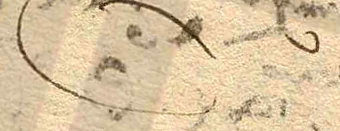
Co
